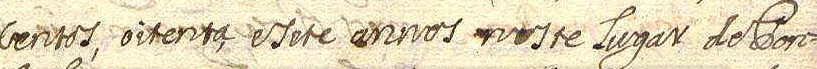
centos, oitenta, e sete annos neste lugar de Pon
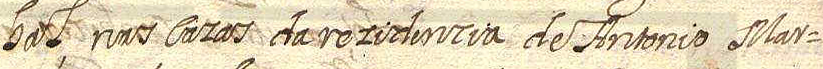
bal, nas cazas da rezidencia de Antonio Mar
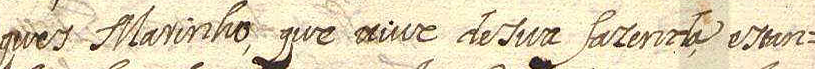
ques Marinho, que uiue de sua fazenda, estan
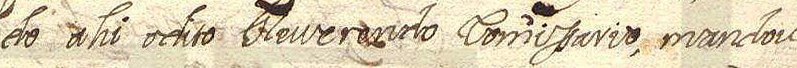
do ahi o dito Reuerendo Com̄issario, mandou
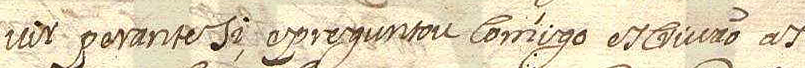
uir perante si, e preguntou comigo escriuaõ as
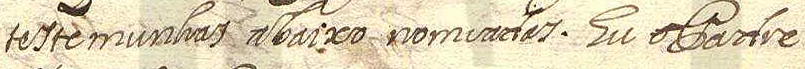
testemunhas abaixo nomeadas. Eu o Padre
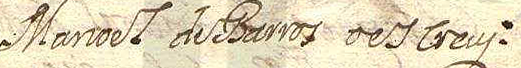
Manoel de Barros o escreuj.
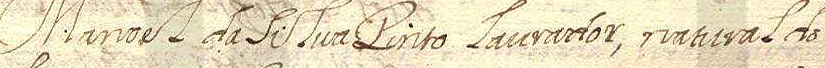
Manoel da Silua Pinto Laurador, natural do
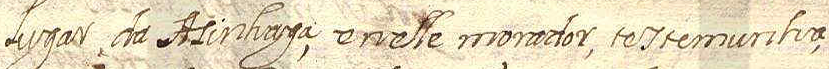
Lugar da Azinhaga, e nelle morador, testemunha,
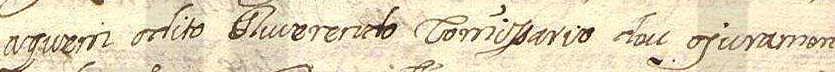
a quem o dito Reuerendo Com̄issario dou o juramen
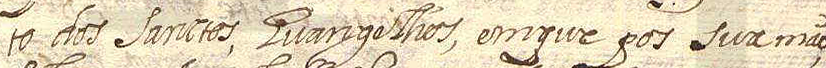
to dos Sanctos, Euangelhos, em que pos sua maõ,
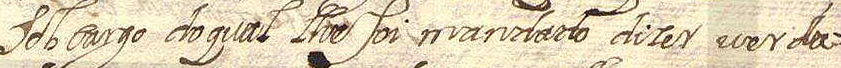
Sob cargo do qual lhe foi mandado dizer uerda
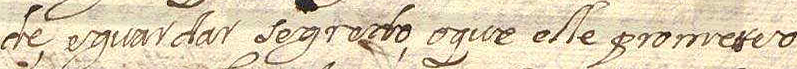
de, e guardar segredo, o que elle prometteo
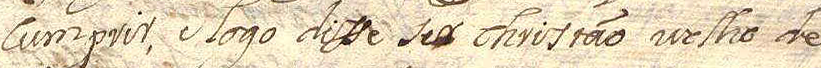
cumprir, e logo disse ser christaõ uelho de
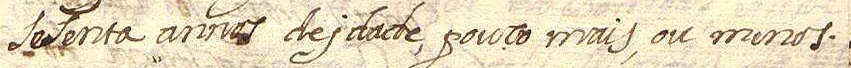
sesenta annos de jdade, pouco mais, ou menos.
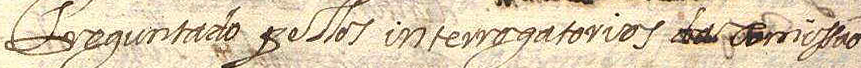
Preguntado pellos interrogatorios da comissaõ
